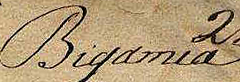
Bigamia
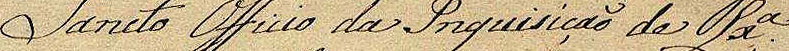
Sancto Officio da Inquisição de Lxa.
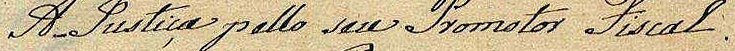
A Iustiça pello seu Promotor Fiscal.
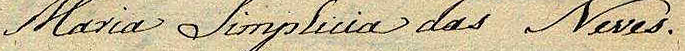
Maria Simplicia das Neves.
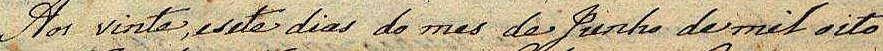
Aos vinte, e sete dias do mes de Junho de mil oito
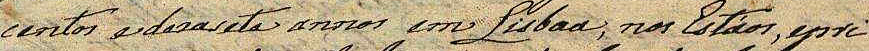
centos e dezasete annos em Lisboa, nos Estáos, e pri
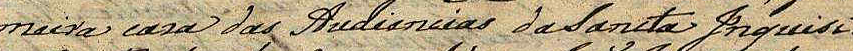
meira caza das Audiencias da Sancta Jnquisi
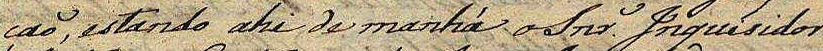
çaõ, estando ahi de manhã o Snr̄. Jnquisidor
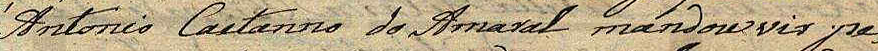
Antonio Caetanno do Amaral mandou vir pe
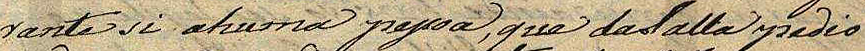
rante si a huma pessoa, que na Salla pedio
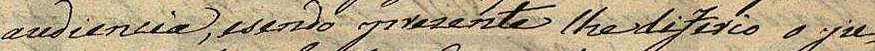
audiencia, e sendo prezente lhe diferio o ju
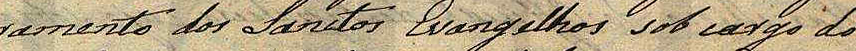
ramento dos Sanctos Evangelhos sob cargo do
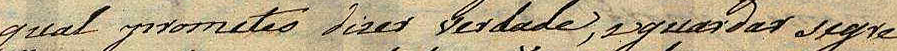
qual prometeo dizer verdade, e guardar segre
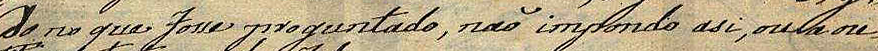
do no que fosse proguntado, naõ impondo asi, ou a ou
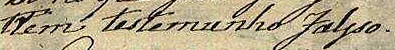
trem testemunho falso.
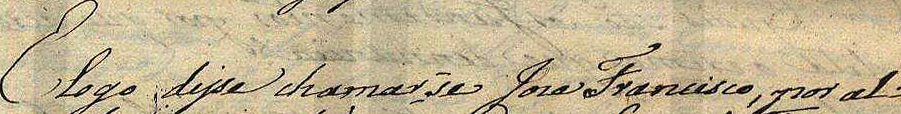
E Logo disse chamar-se Joze Francisco, por al
